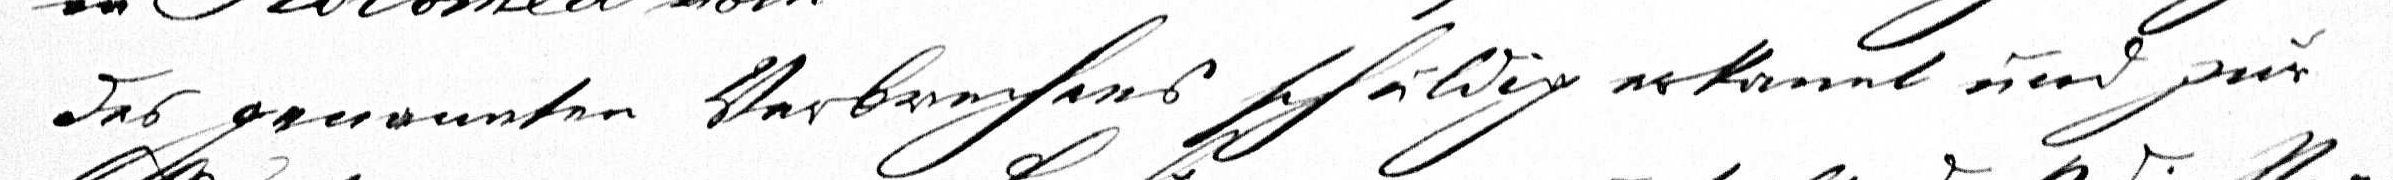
des genannte Verbrechens schuldig erkannt und zur
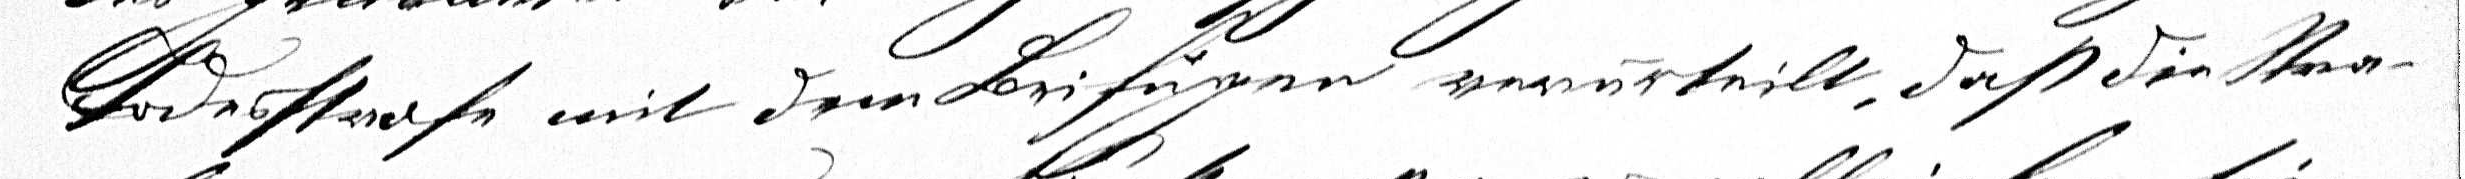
Todesstrafe mit dem Beifügen verurtheilt, daß die Stra¬
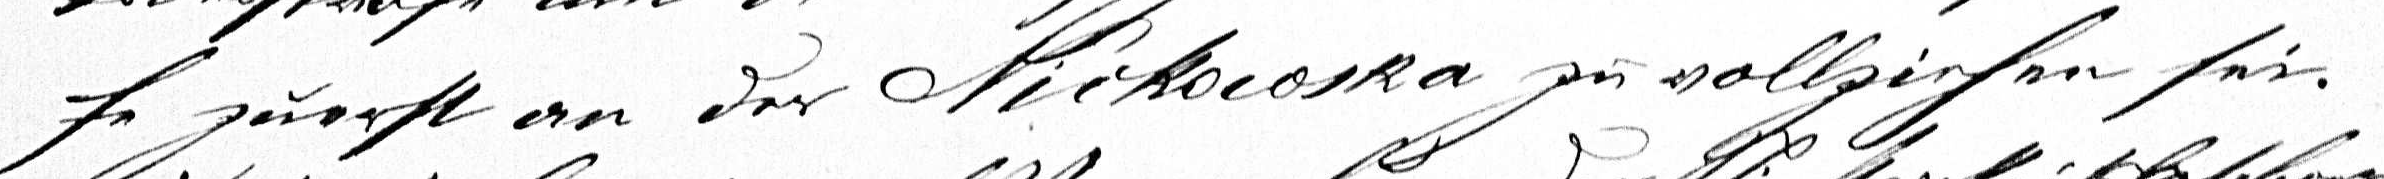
fe zuerst an der Nickowska zu vollziehen sei.
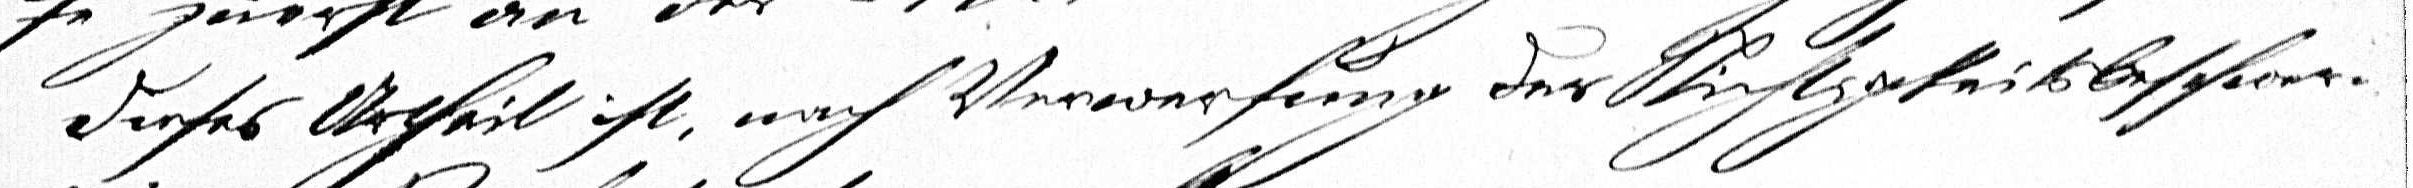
Dieses Urtheil ist, nach Verwerfung der Nichtigkeitsbeschwer¬
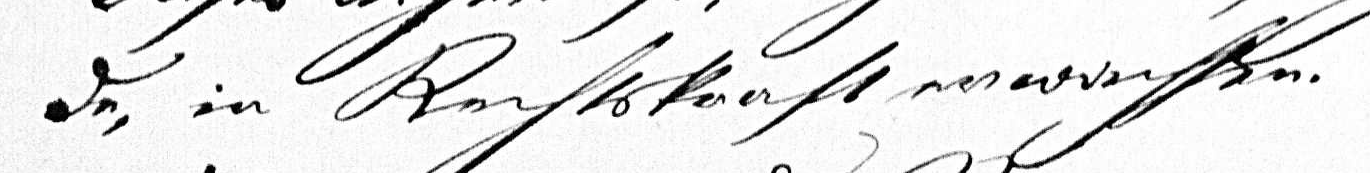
de, in Rechtskraft erwachsen.
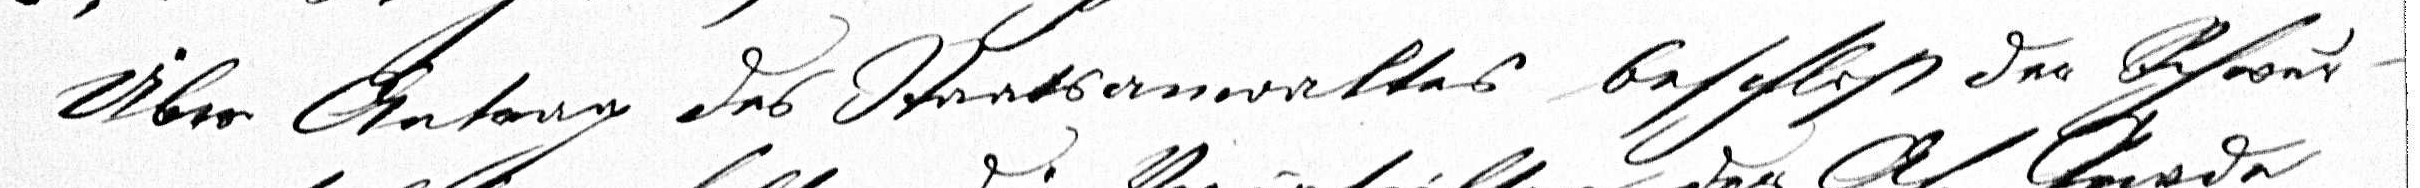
Über Antrag des Staatsanwaltes beschloß der Schwur¬
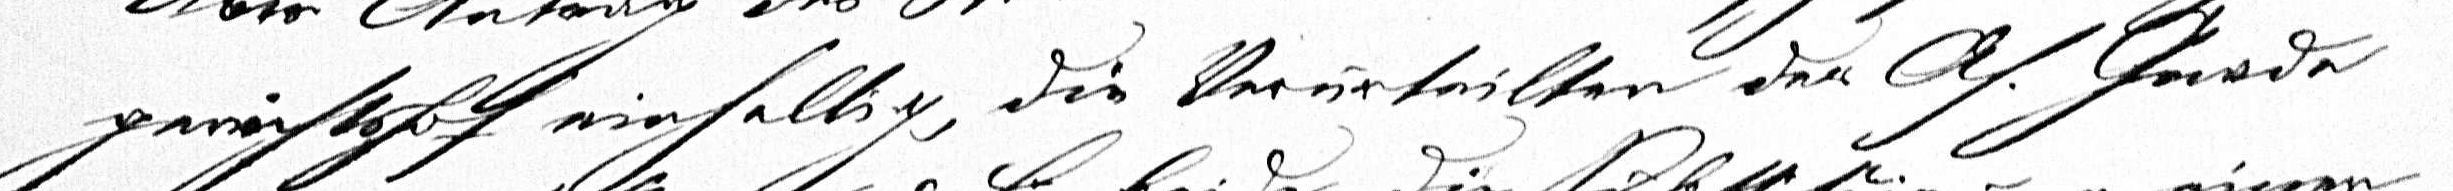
gerichtshof einhellig, die Verurtheilten der Ah. Gnade
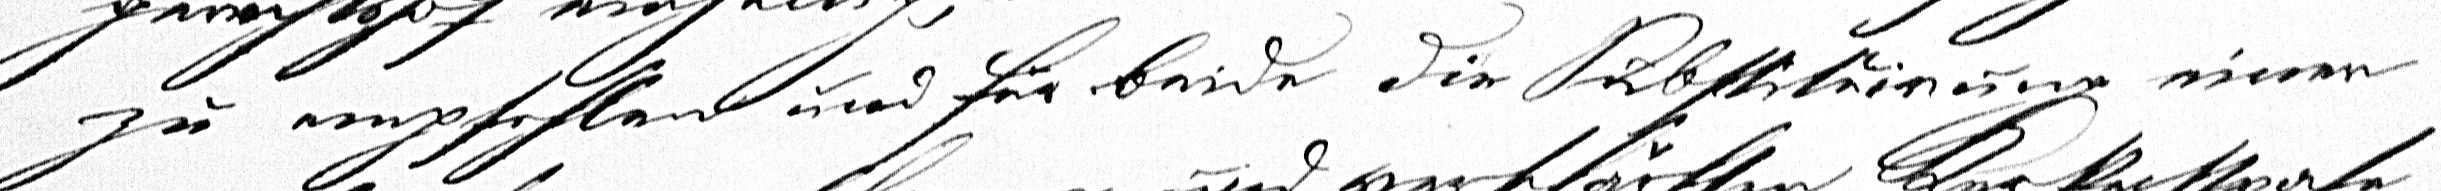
zu empfehlen und für beide die Substituirung einen
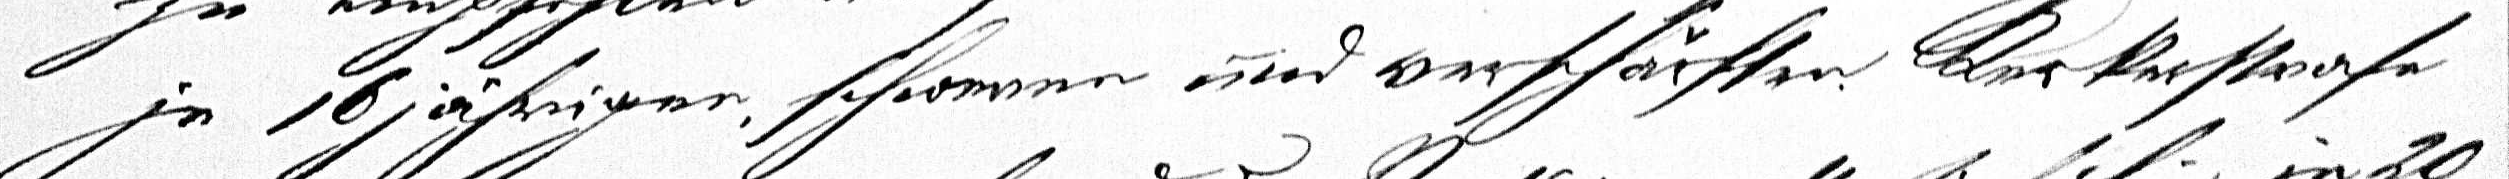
je 16jährigen, schweren und verschärften Kerkerstrafe
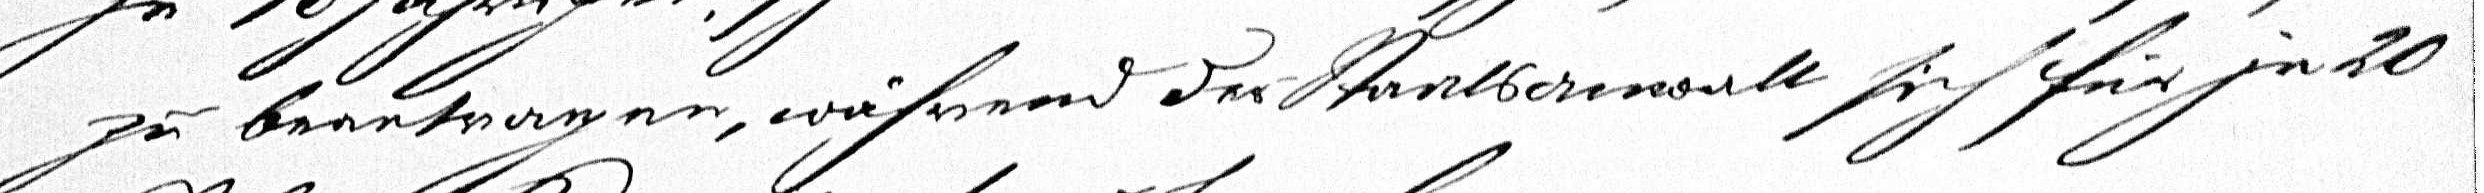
zu beantragen, während der Staatsanwalt sich für je 20
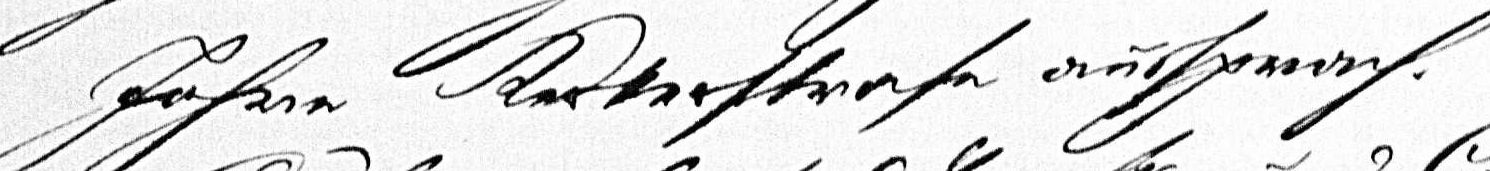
Jahren Kerkerstrafe aussprach.
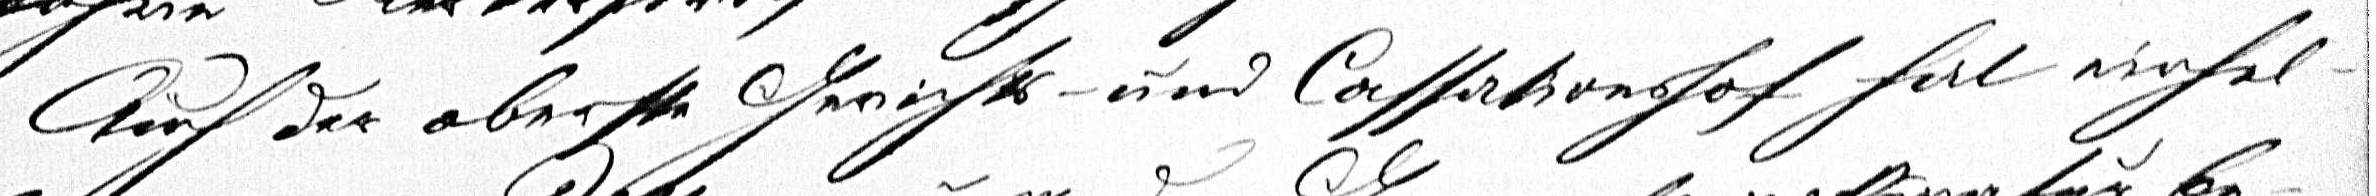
Auch der oberste Gerichts- und Cassationshof hat einhel¬
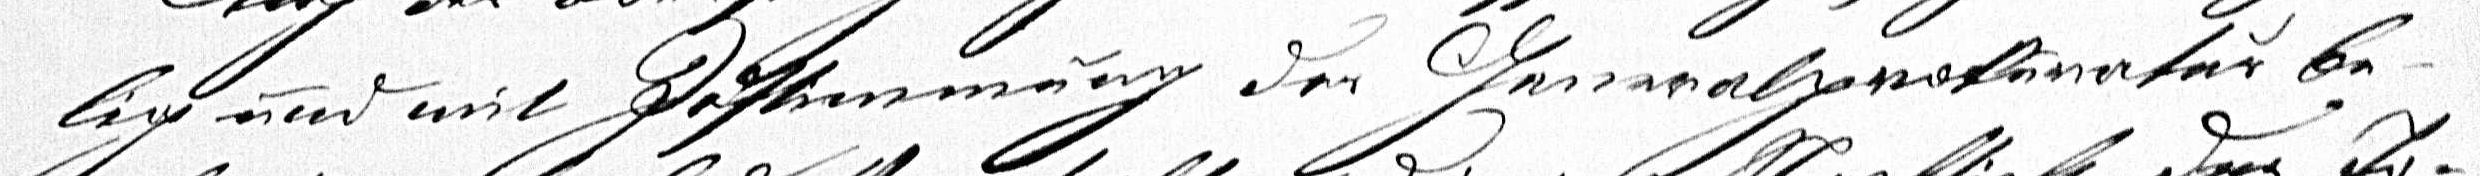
lig und mit Zustimmung der Generalprokuratur be¬
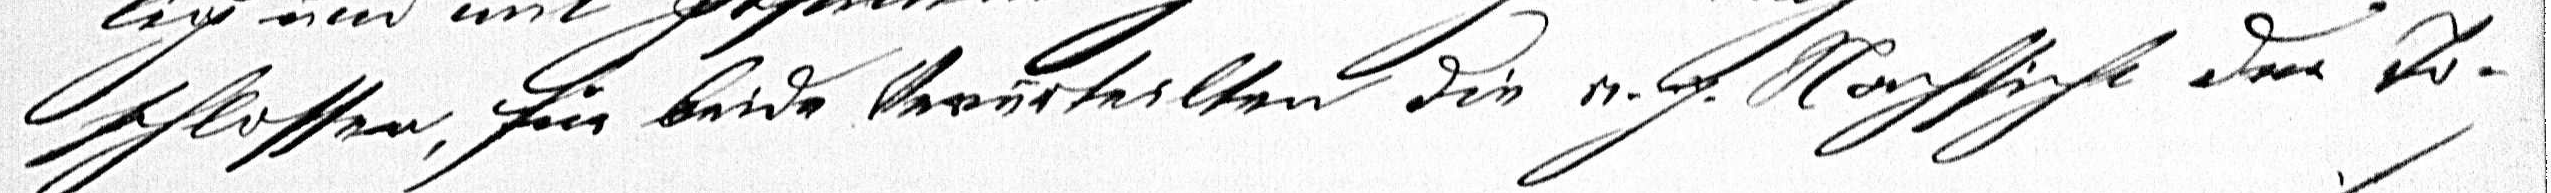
schlossen, für beide Verurtheilten die a.g. Nachsicht der To¬
